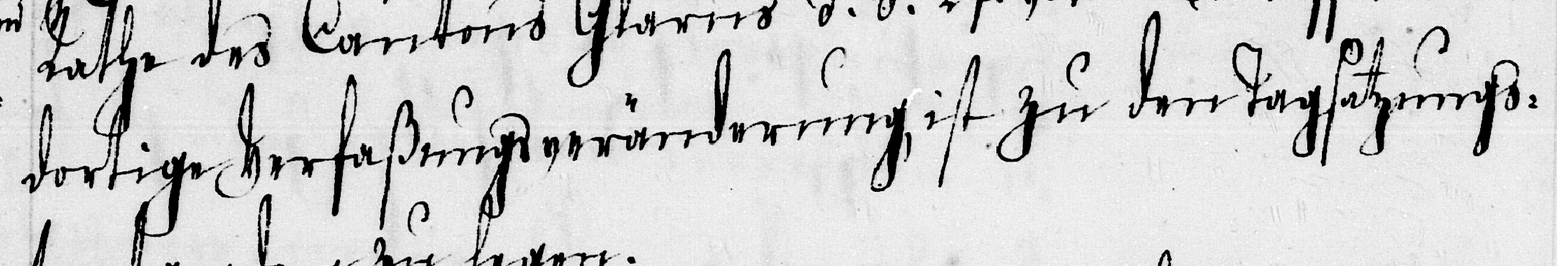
dortige Verfaßungsveränderung, ist zu den Tagsatzungs¬
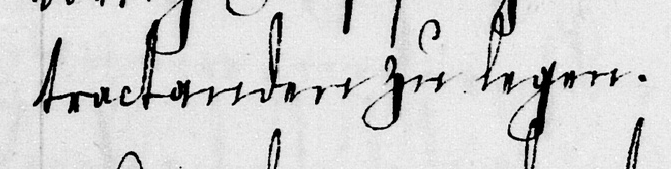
tractanden zu legen.
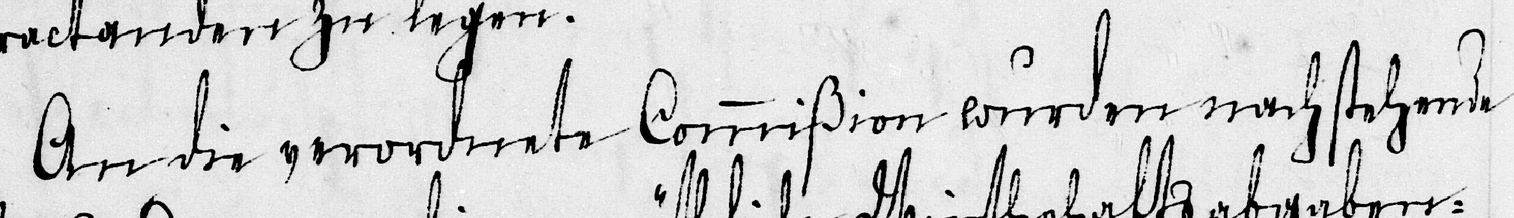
An die verordnete Commißion wurden nachstehende
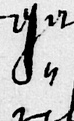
te
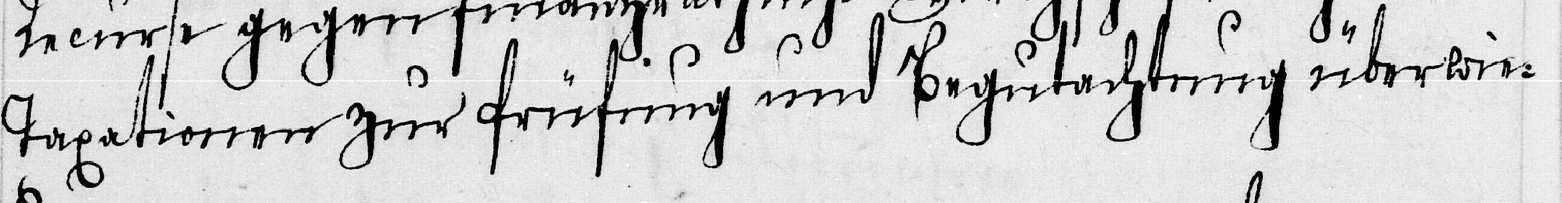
axation zur Prüfung und Begutachtung überwie¬
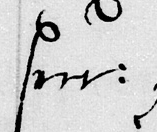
sen:
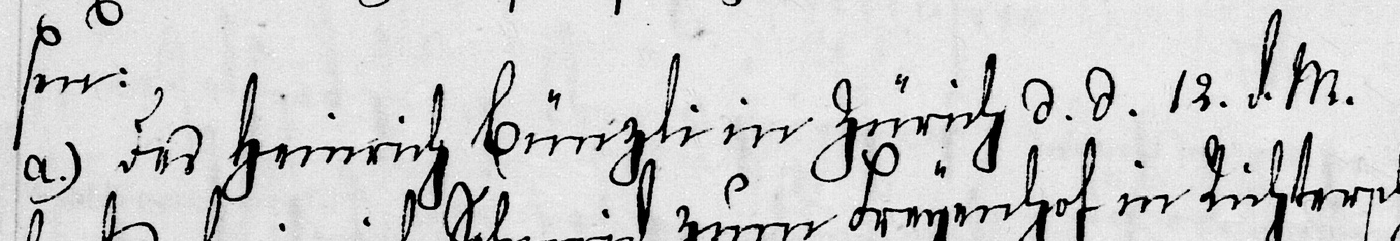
a.) Des Heinrich Bünzli in Zürich d. d. 12. d. M.
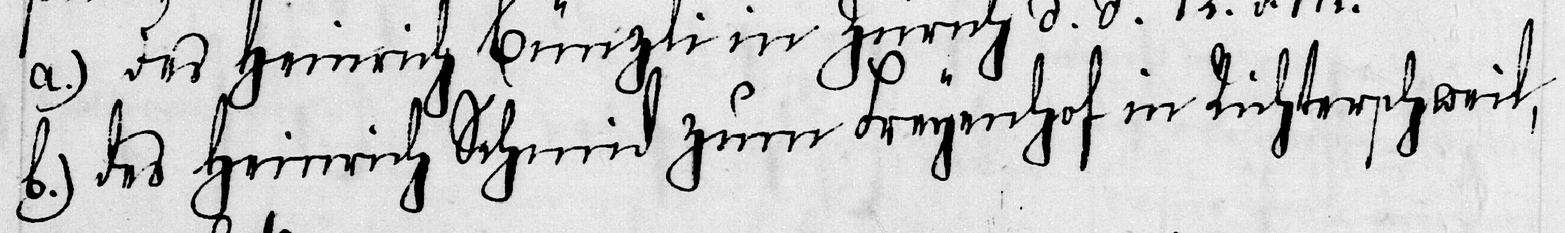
b.) des Heinrich Schmid zum Freyenhof in Richterschweil
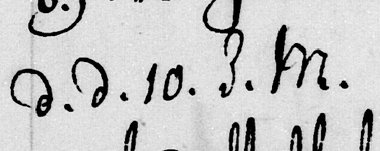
d. d. 10. d. M.
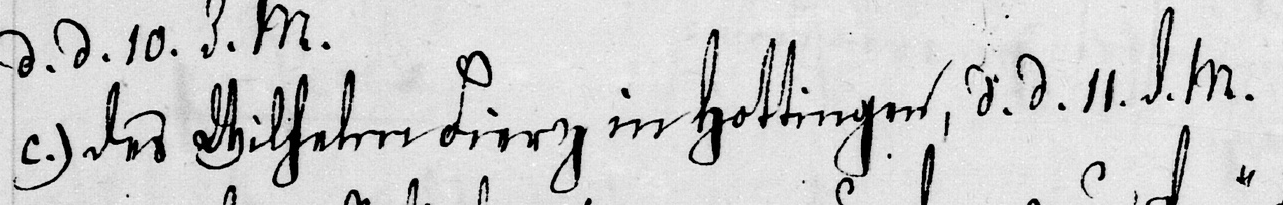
c.) des Wilhelm Fierz in Hottingen, d. d. 11. d.
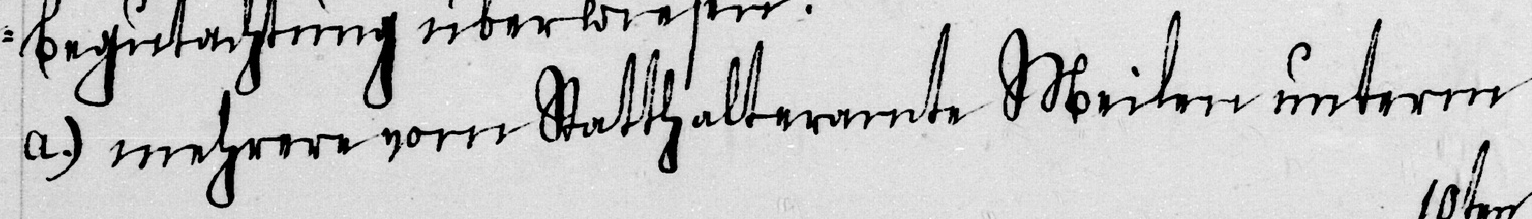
a.) mehrere vom Statthalteramte Meilen unterm
